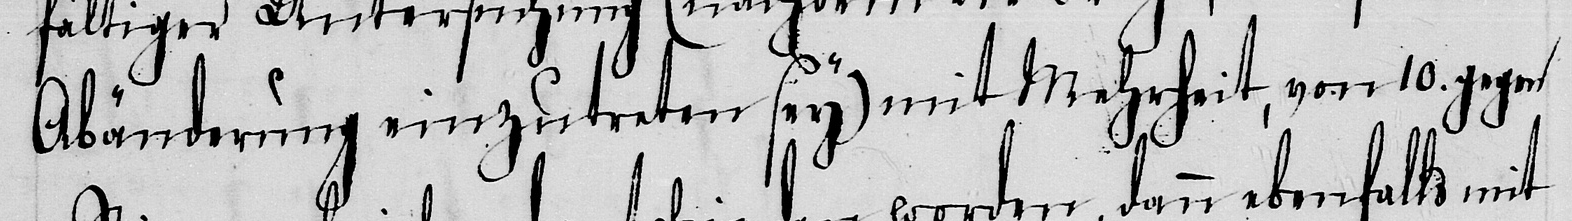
Abänderung einzutreten sey) mit Mehrheit, von 10. gegen
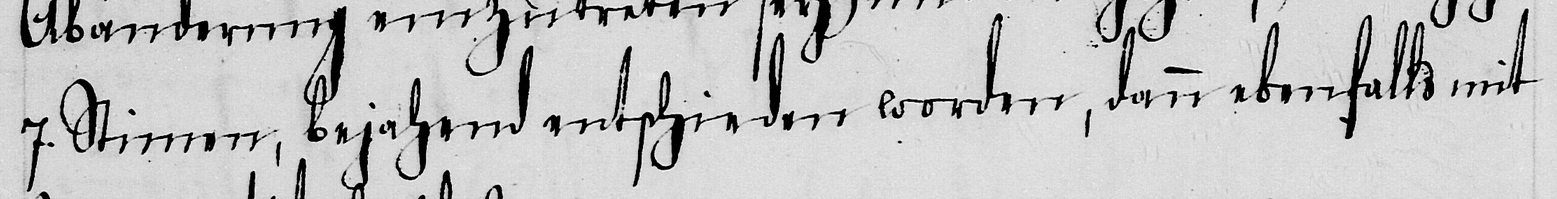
7. Stimmen, bejahend entschieden worden, dann ebenfalls mit
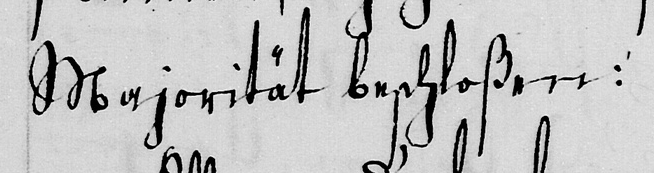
Majorität beschloßen:
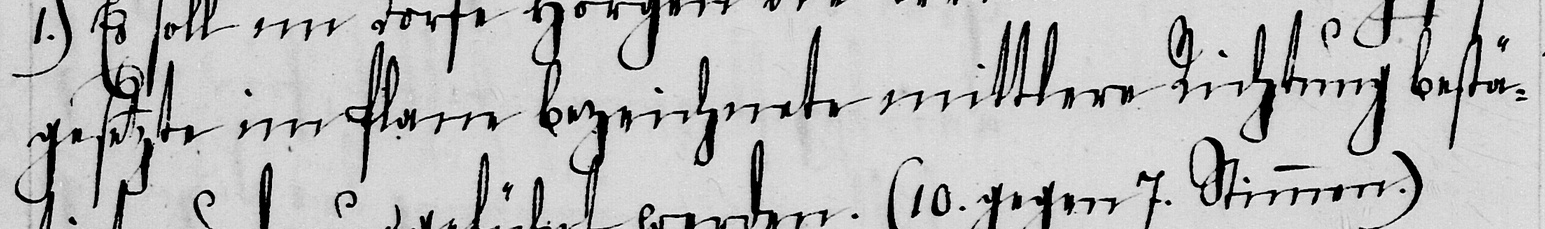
gesetzte im Plane bezeichnete mittlere Richtung bestä¬
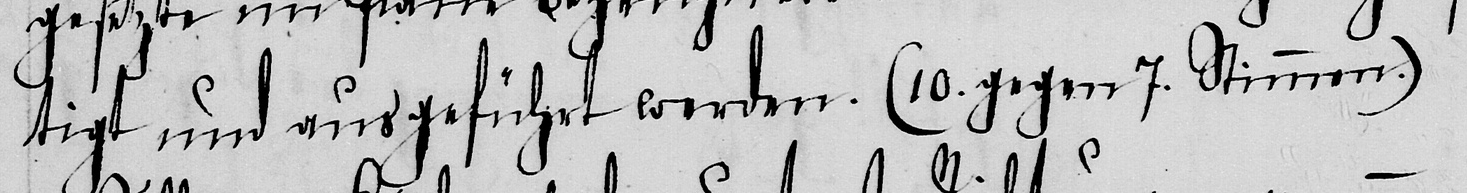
tigt und ausgeführt werden. (10. gegen 7. Stimmen.)
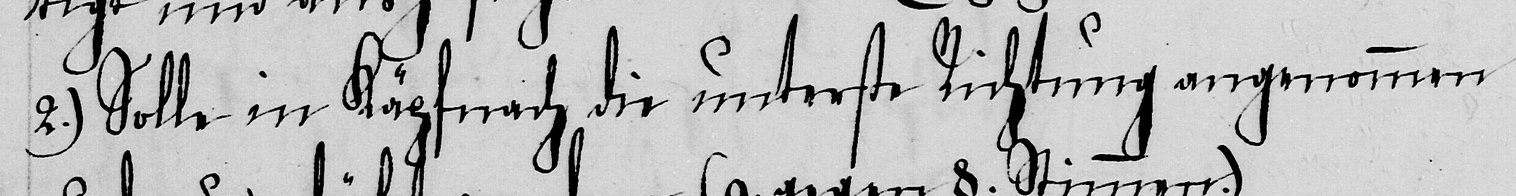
2.) Solle in Käpfnach die unterste Richtung angenommen
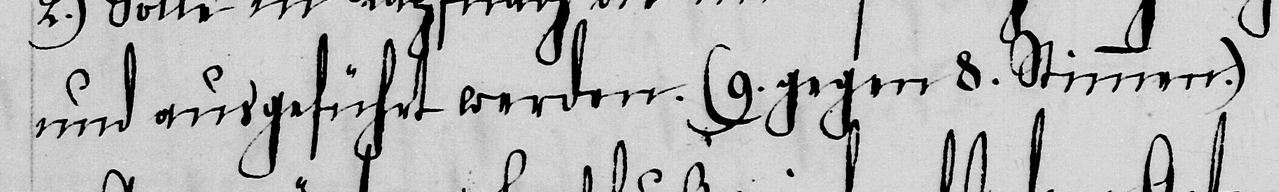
und ausgeführt werden. (9. gegen 8. Stimmen.)
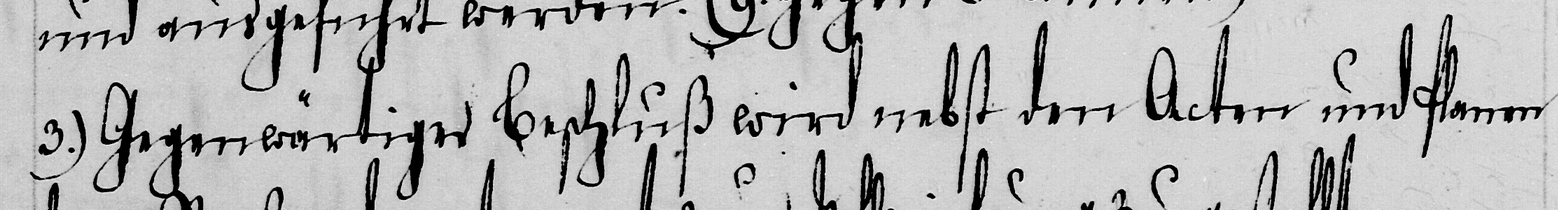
3.) Gegenwärtiger Beschluß wird nebst den Acten und Planen
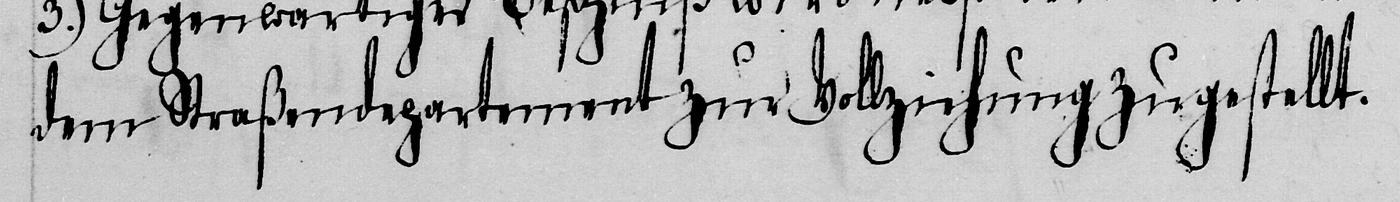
dem Straßendepartement zur Vollziehung zugestellt.
